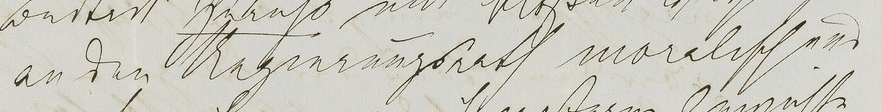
an den Regierungsrath moralisch und
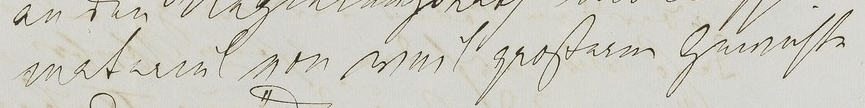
materiel von weit größerm Gewichte
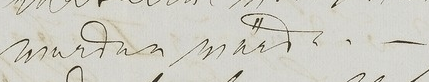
werden würde. –
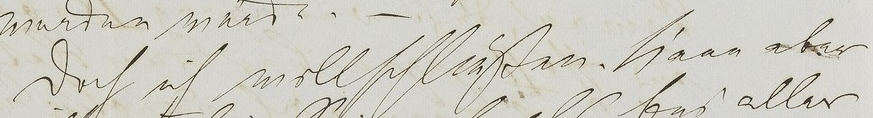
Doch ich will schließen. Kann aber
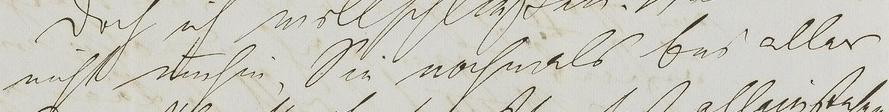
nicht umhin, Sie nochmals bei aller
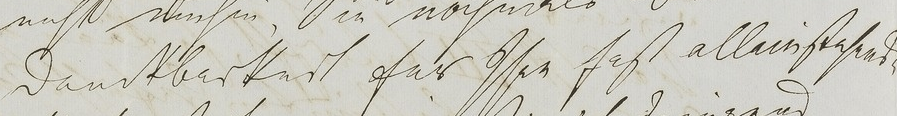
Danckbarkeit für Ihre fast alleinstehende
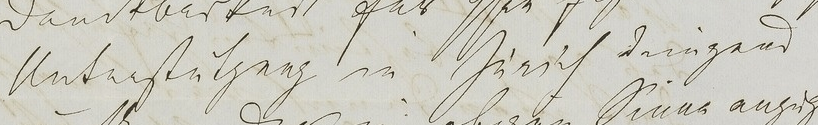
Unterstützung in Zürich dringend
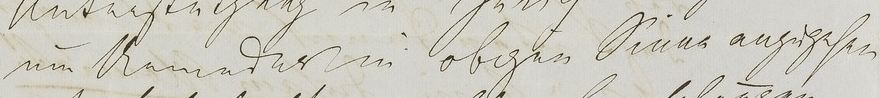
um Remedur im obigen Sinne anzugehen.
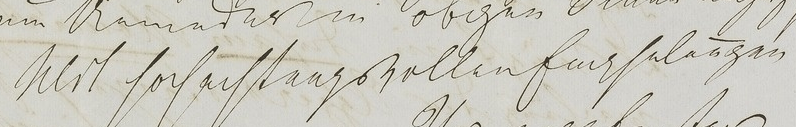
Mit hochachtungsvollen Emphelungen
